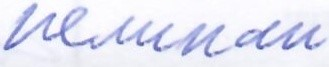пеликан
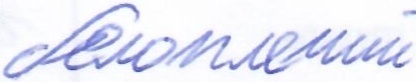белоплечий
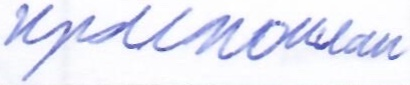красношап
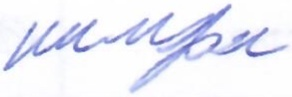нимфа
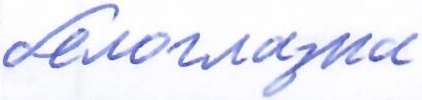белоглазка
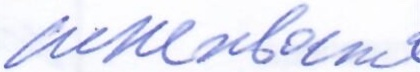синехвостя
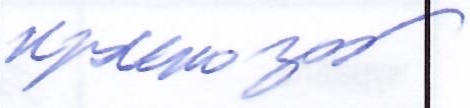краснозоб
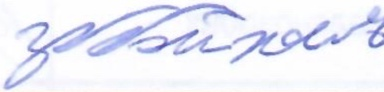забойхаль
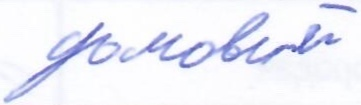домовий
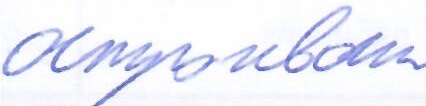острохвост
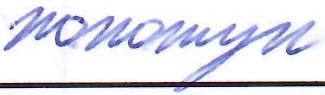хохотун
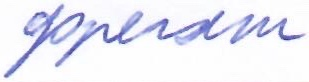фрегат
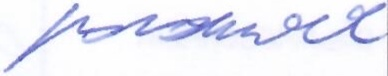рогатяя
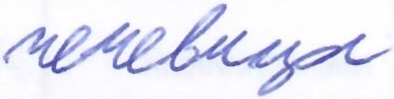чечевица
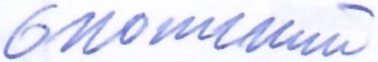охотский
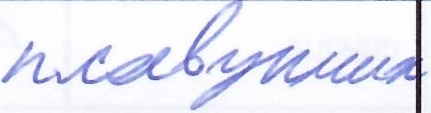плавунчик
